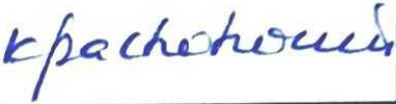красноногий
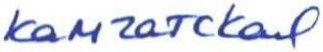камчатская
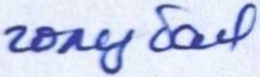голубая
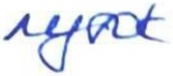луток
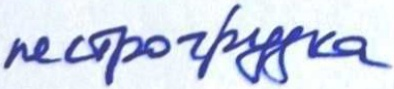пестрогрудка
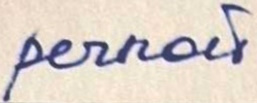речной
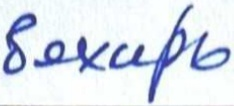вяхирь
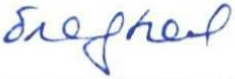бледная
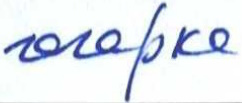гогарка
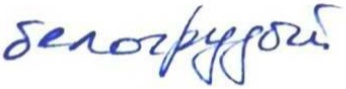белогрудый
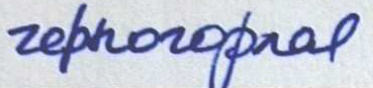черногорлая
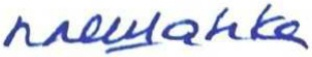плешанка
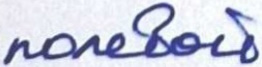полевой
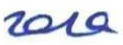гога
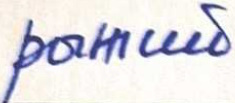рыжий
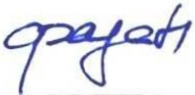фазан
